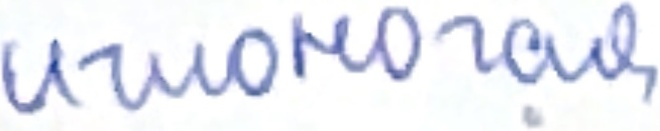иглоногая
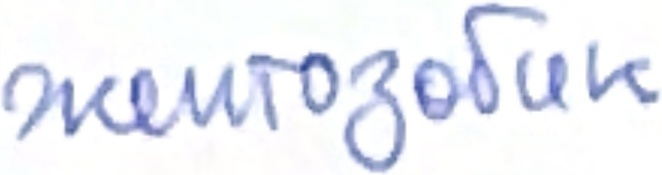желтозобик
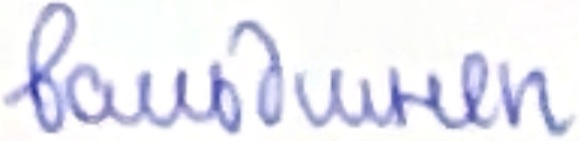вальдшнеп
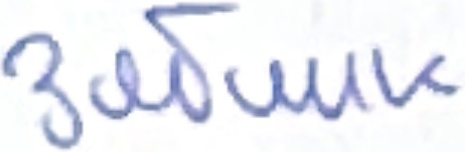зяблик
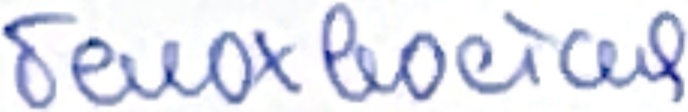белохвостая
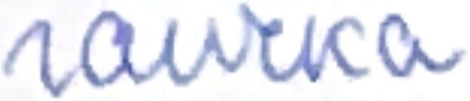гаичка
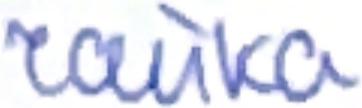чайка
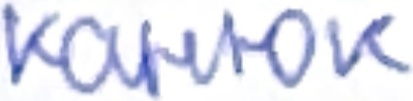канюк
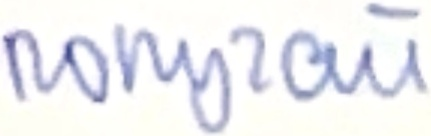попугай
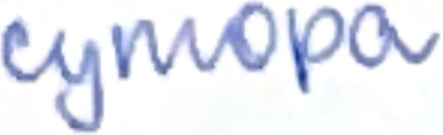сутора
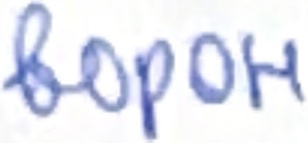ворон
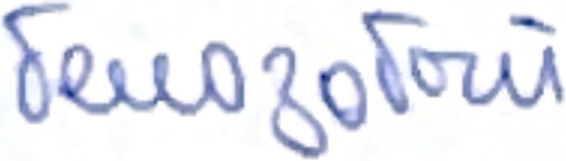белозобый
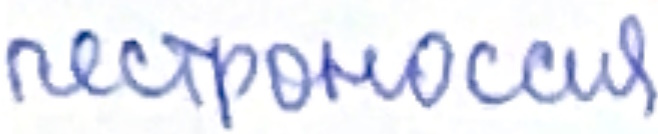пестроносая
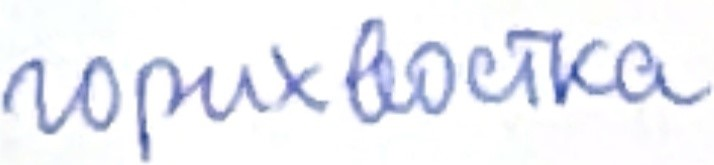горихвостка
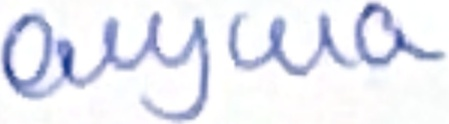олуша
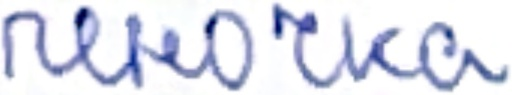пеночка
